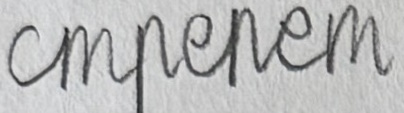стрепет
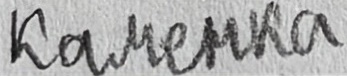каменка
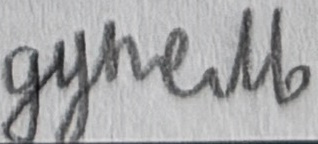дупель
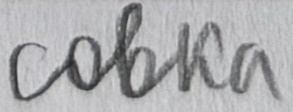совка
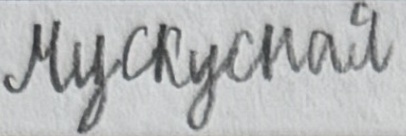мускусная
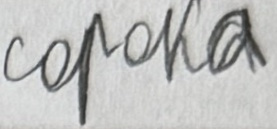сорока
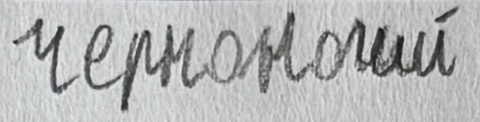черноногий
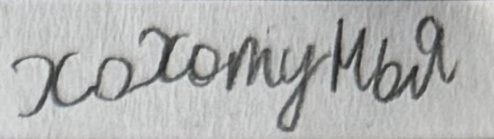хохотунья
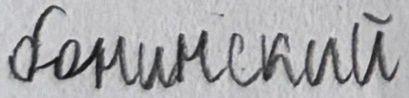бонинский
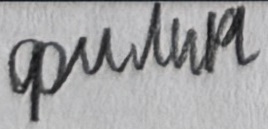филин
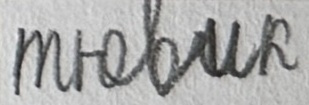тювик
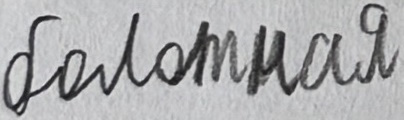болотная
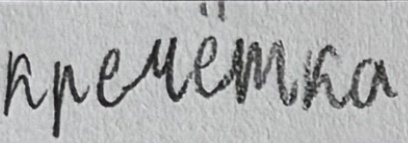кречётка
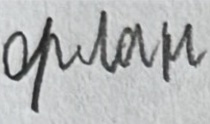орлан
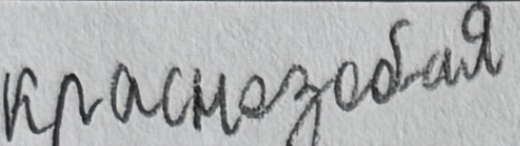краснозобая
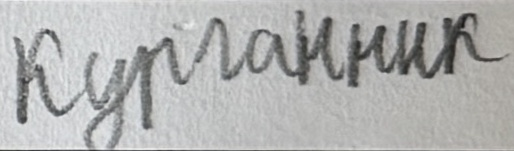курганник
